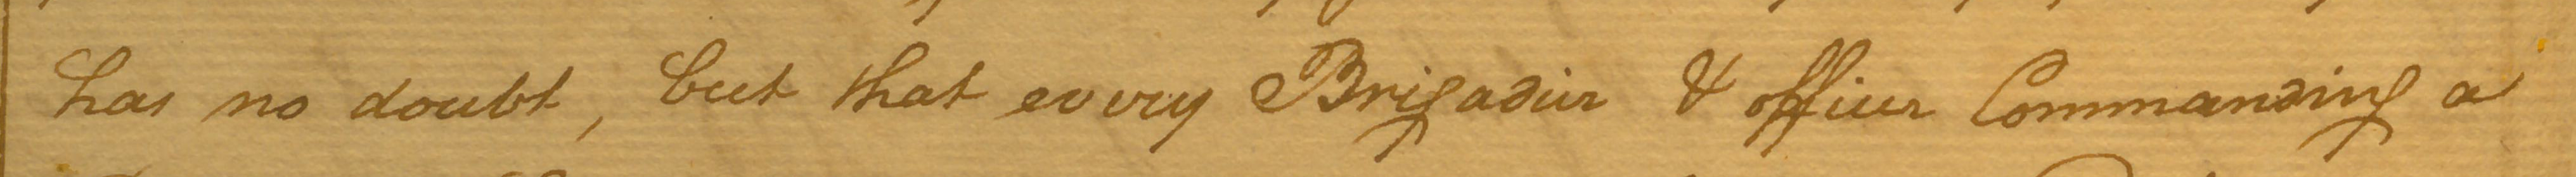has no doubt, but that every Brigadier & officer Commanding a
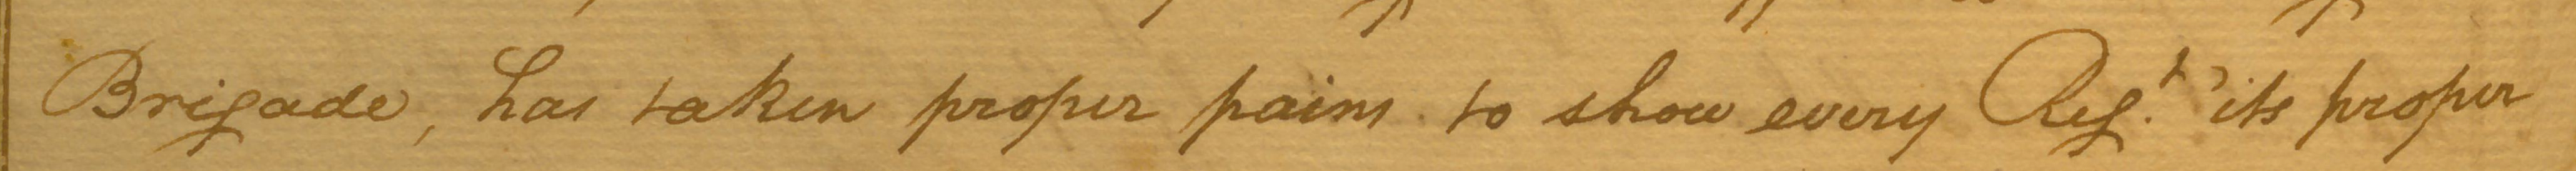Brigade, has taken proper pains to show every Reg^t. its proper
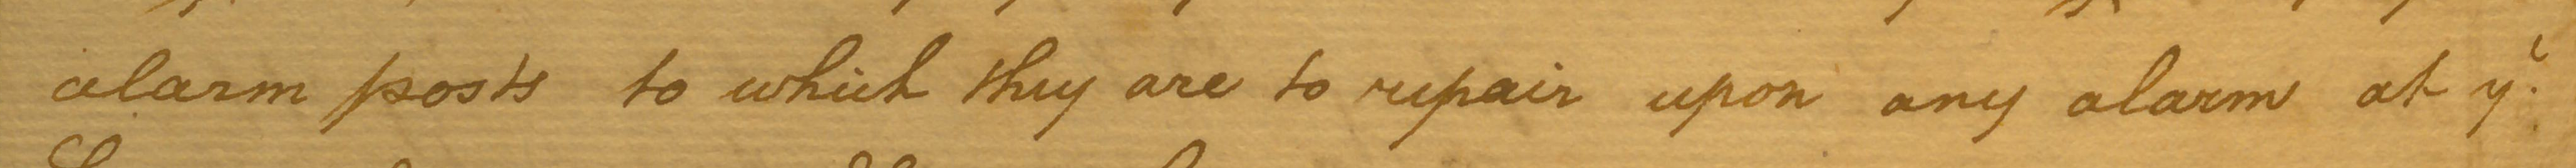alarm posts to which they are to repair upon any alarm of y^e.
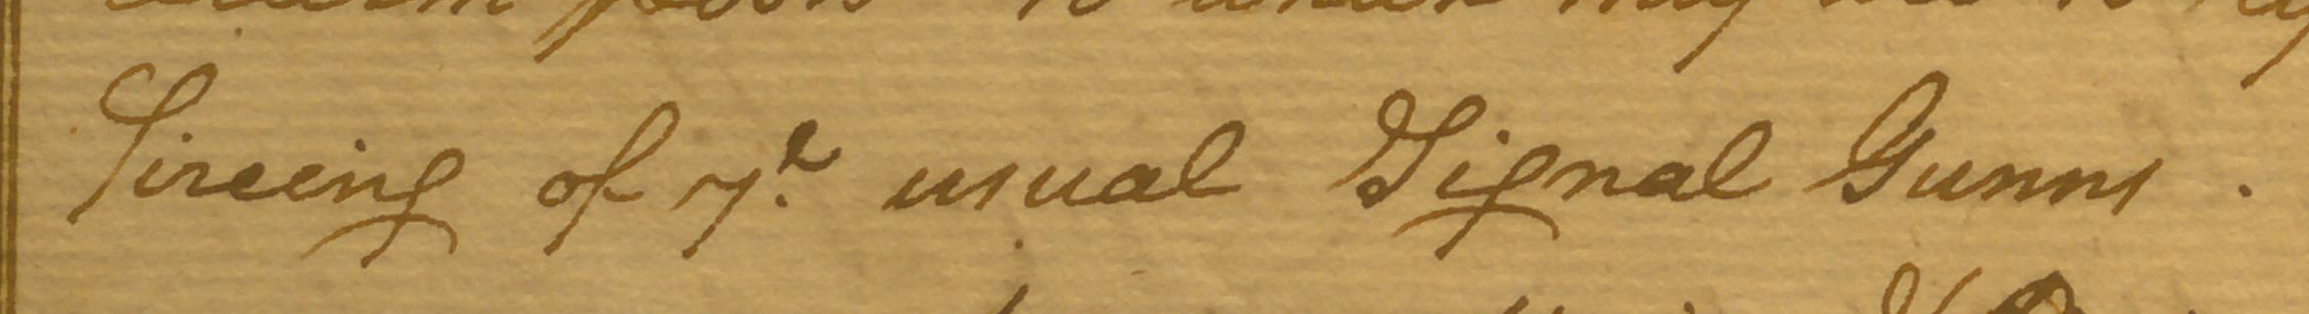fireing of y^e. usual Signal Gunns.
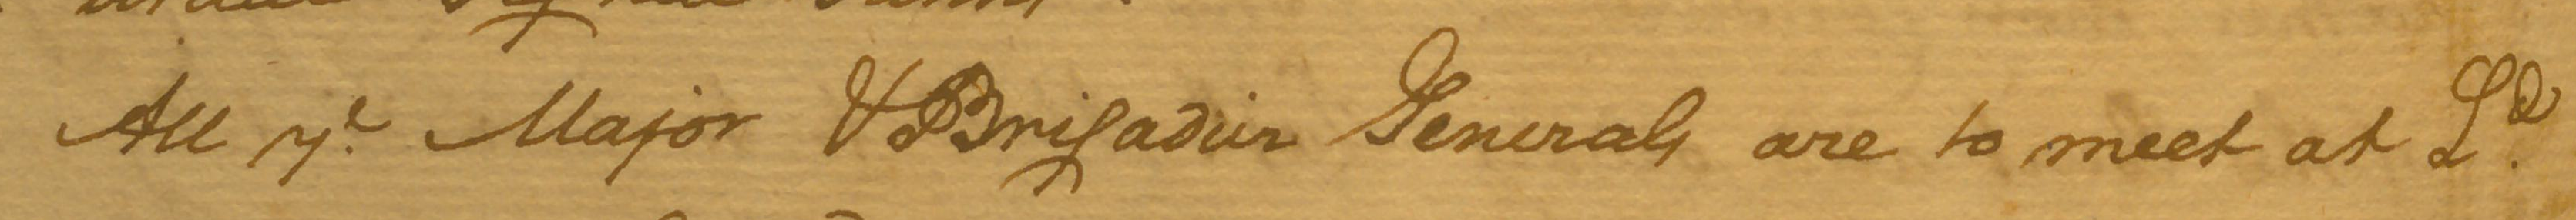All y^e. Major & Brigadier Generals are to meet at L^d.
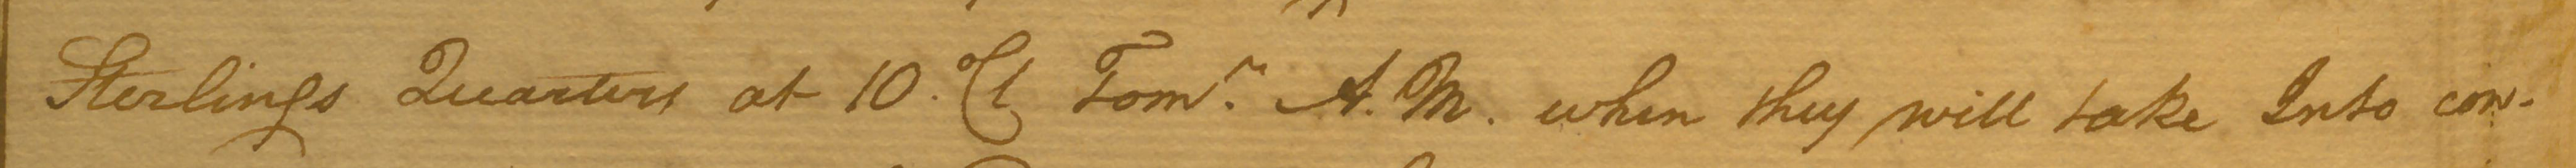Sterlings Quarters at 10 ^oCl Tom^r. A. M. when they will take Into con-
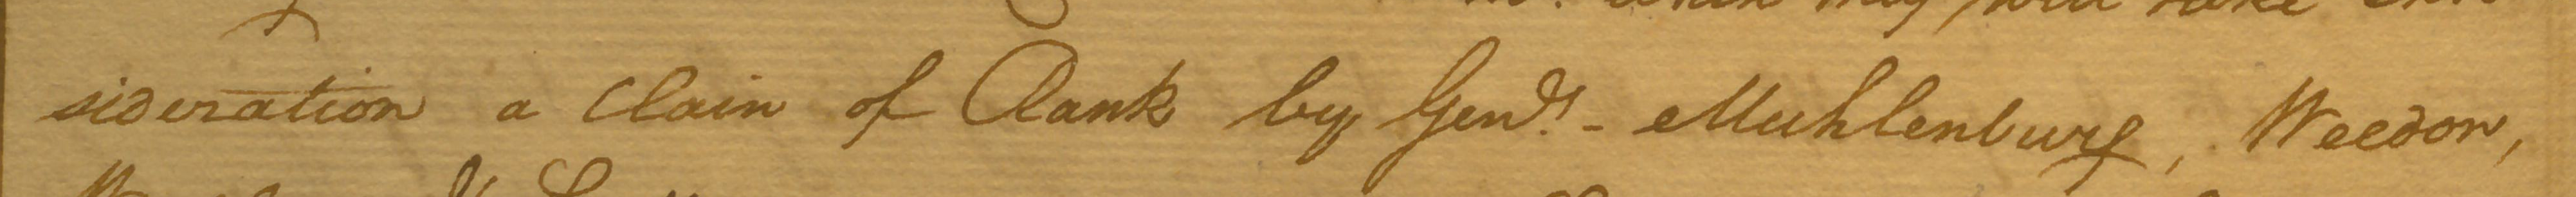sideration a Claim of Rank by Gen^ls. Muhlenburg, Weedon,
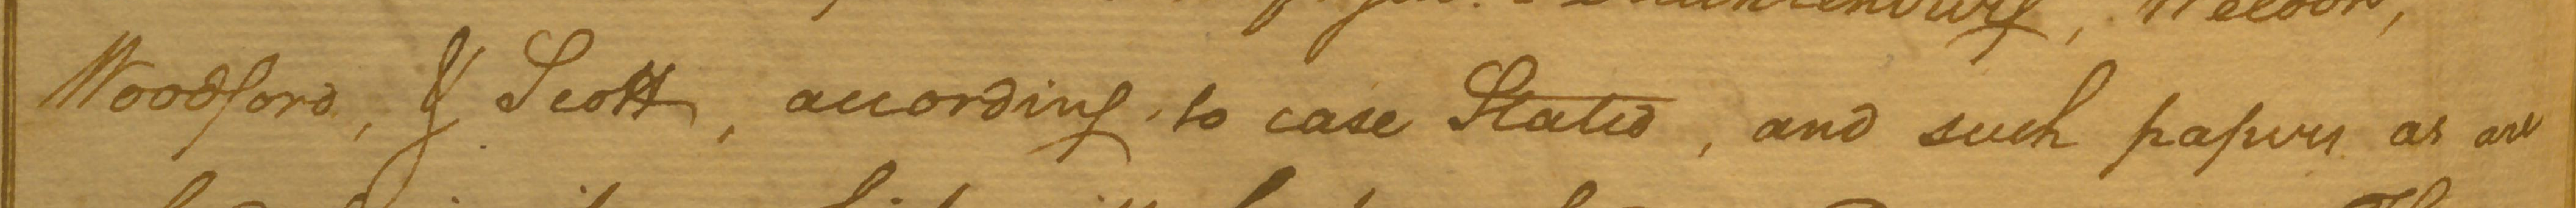Woodford, & Scott, according to case Stated, and such papers as are
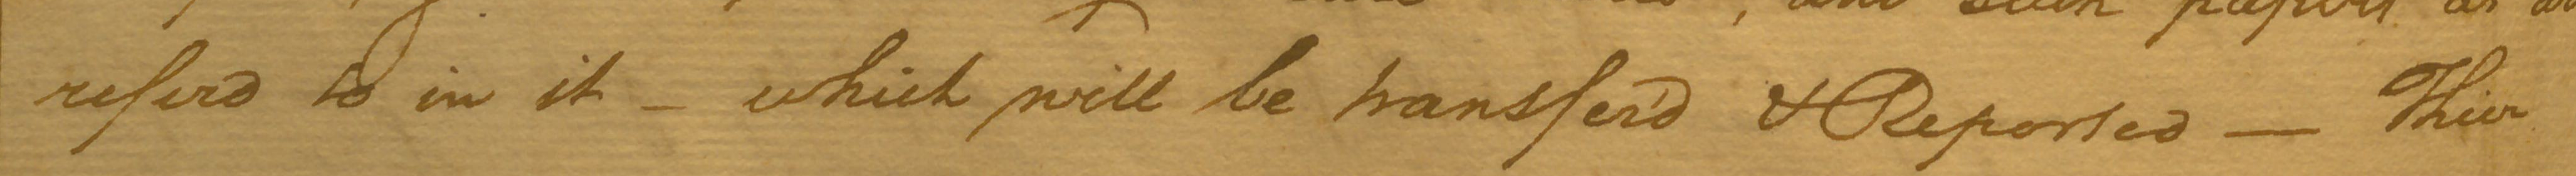referd to in it- which will be transfer'd & Reported- Their
